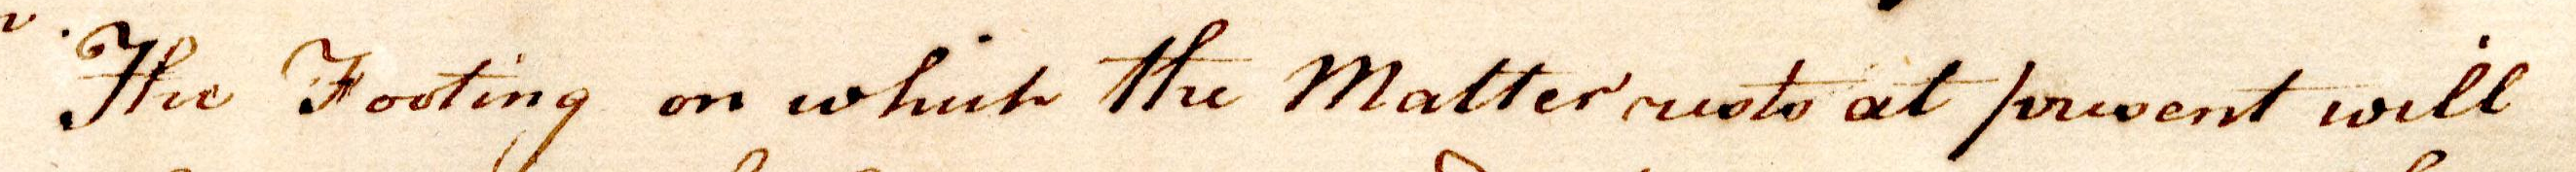The Footing on which the Matter rests at present will
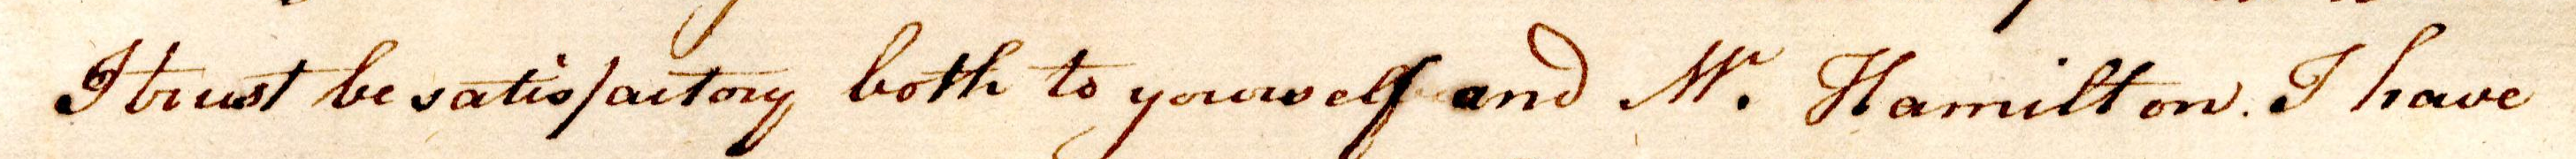I trust be satisfactory both to yourself and M^r. Hamilton. I have
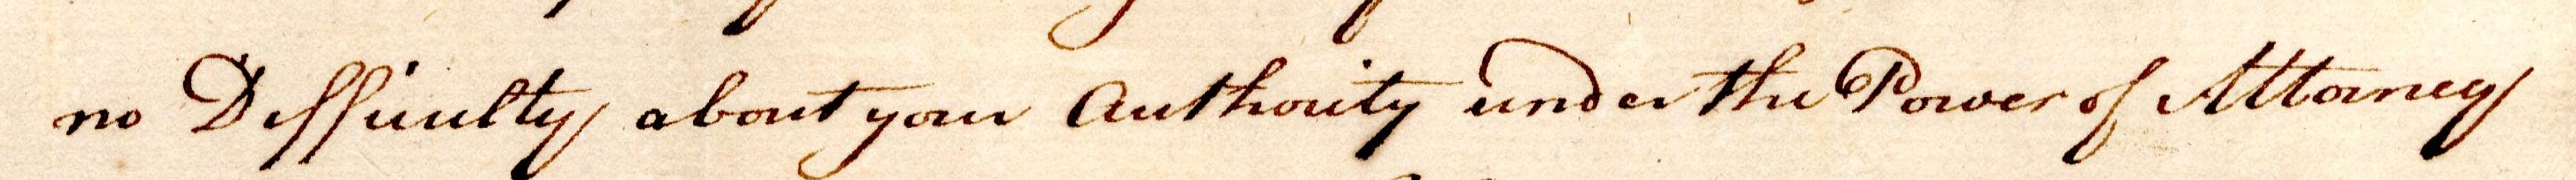no Difficulty about your Authority under the Power of Attorney
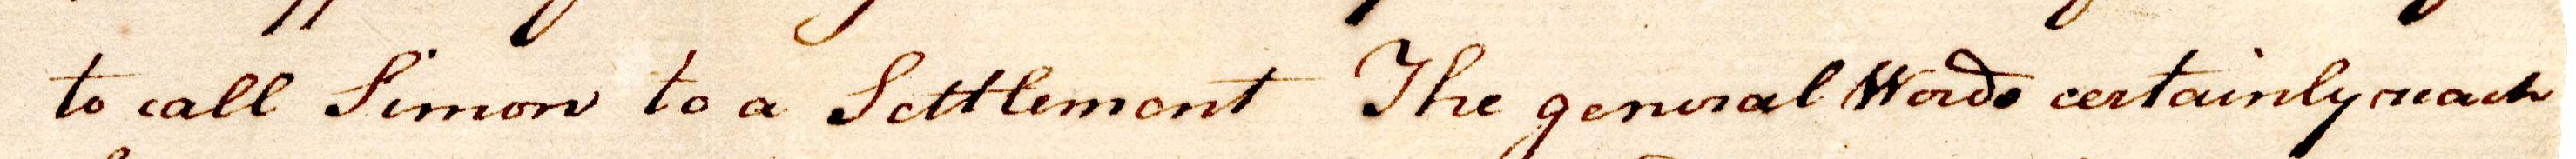to call Simon to a Settlement. The general Words certainly reach
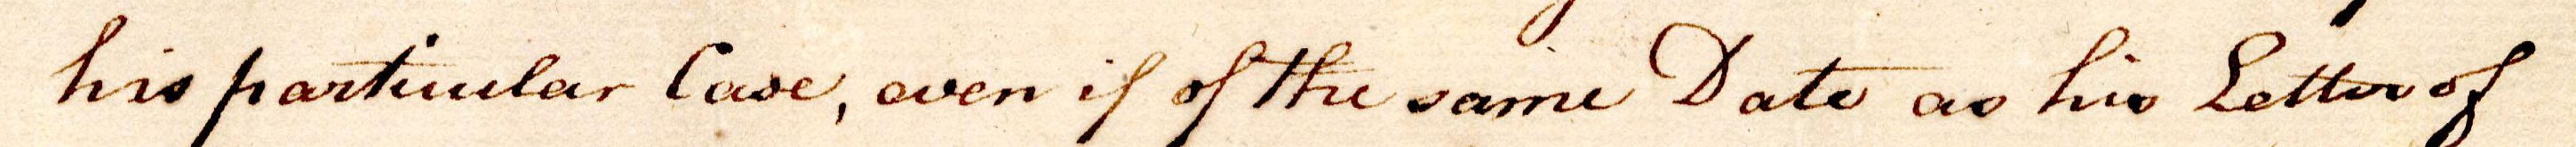his particular Case, even if of the same Date as his Letter of
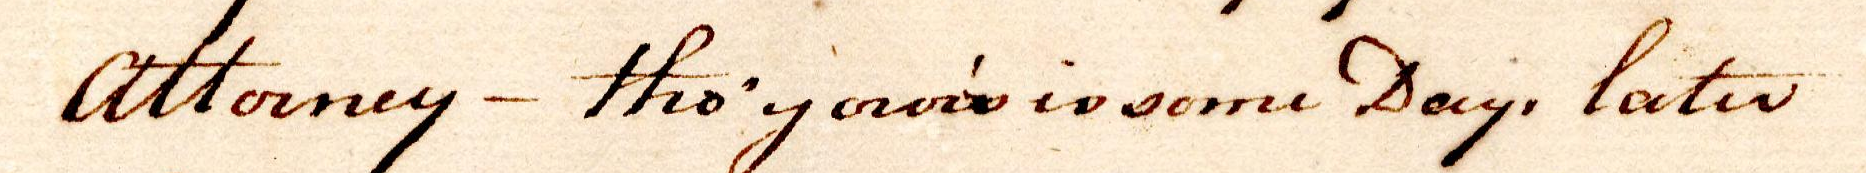Attorney- tho' your's is some Days later
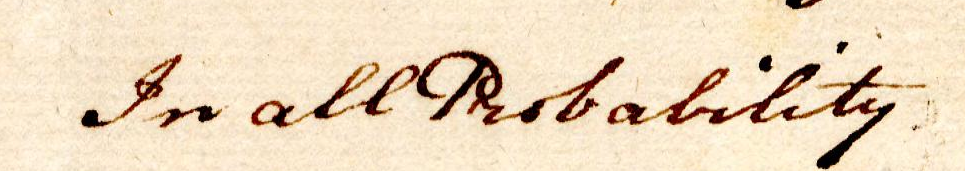In all Probability.
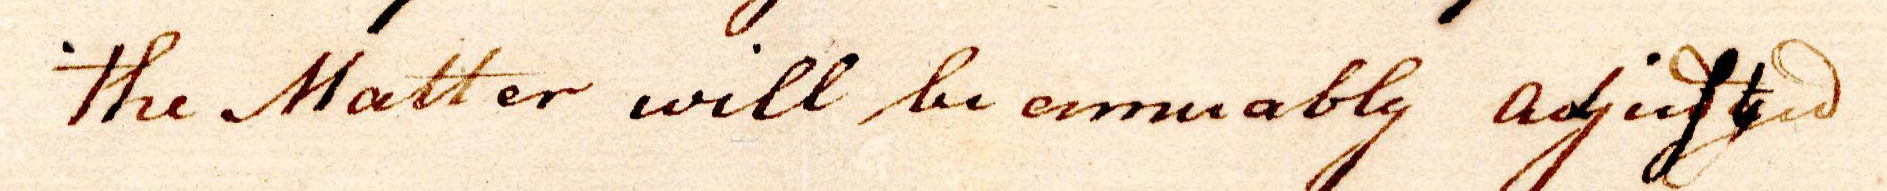The Matter will be amicably adjusted
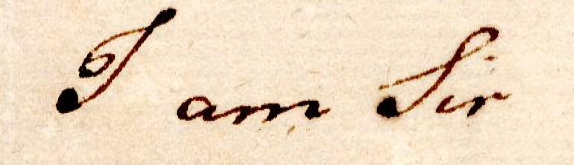I am Sir
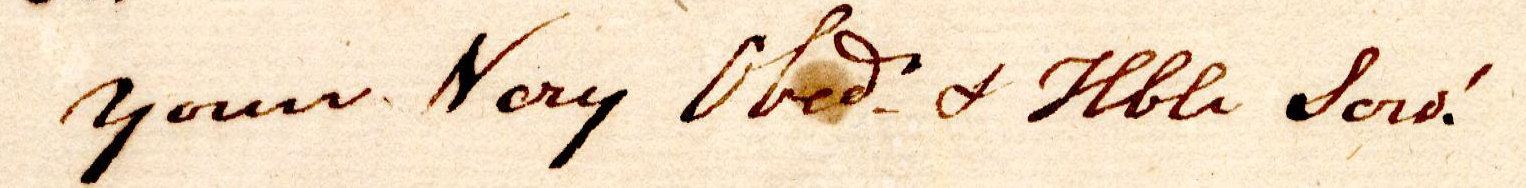your Very Obed^t. & Hble Serv^t.
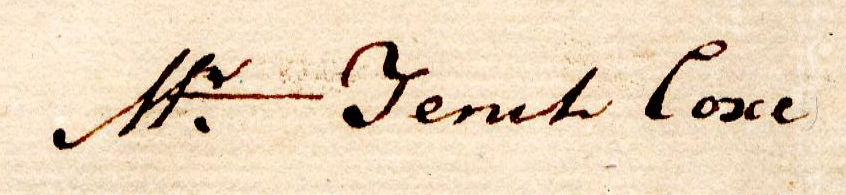M^r. Tench Coxe
